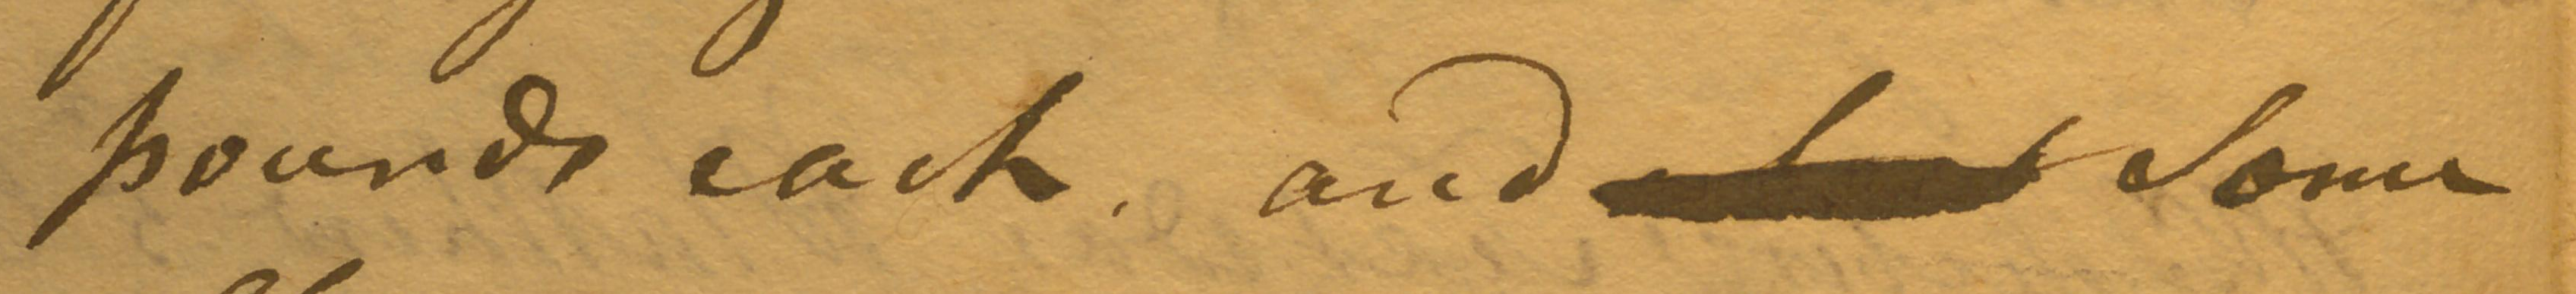pounds each, and [______] some
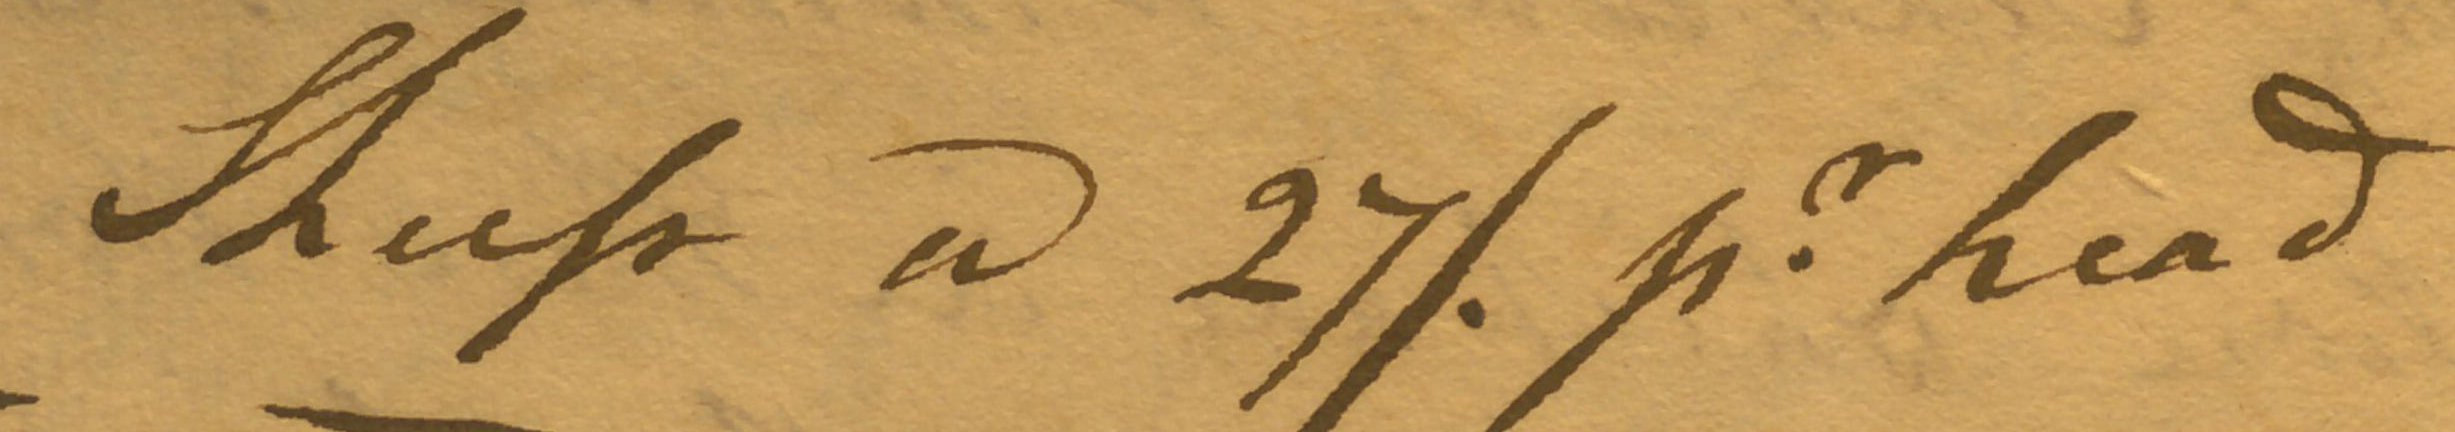sheep w 27s. p^t. head
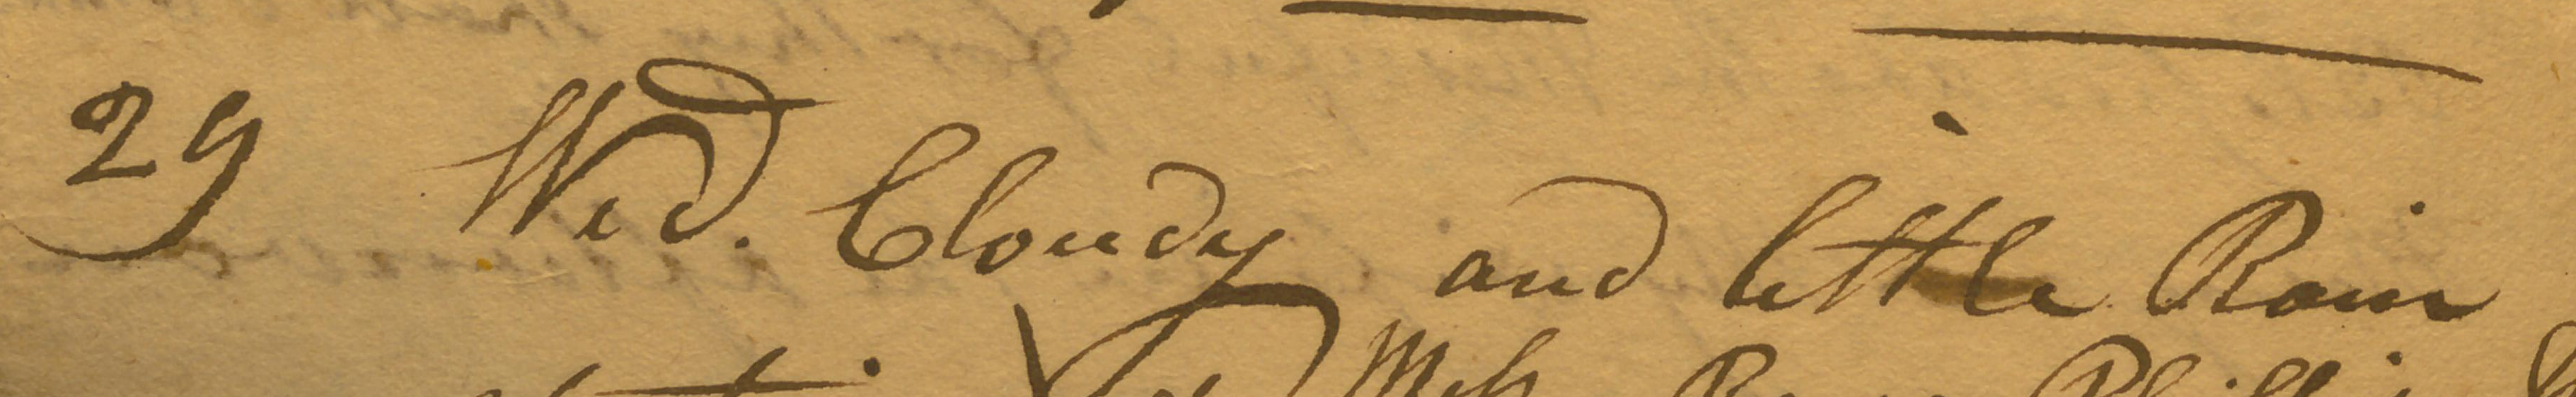29 Wed. Cloudy and little Rain
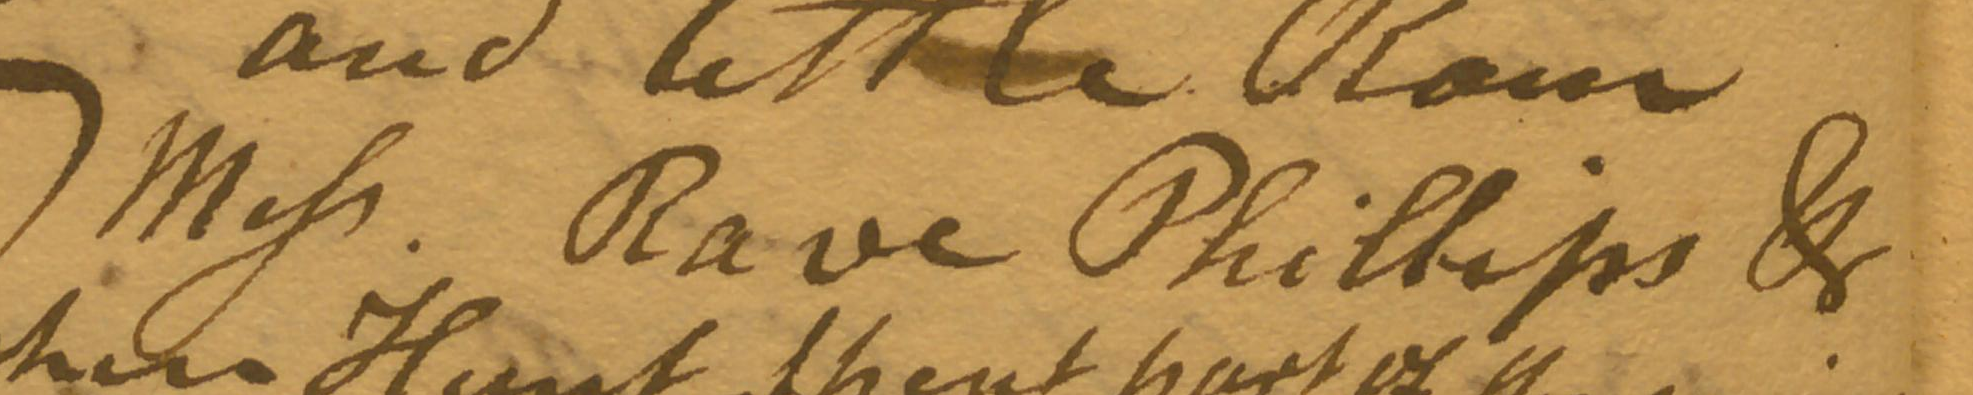Mess. Rave Phillops &
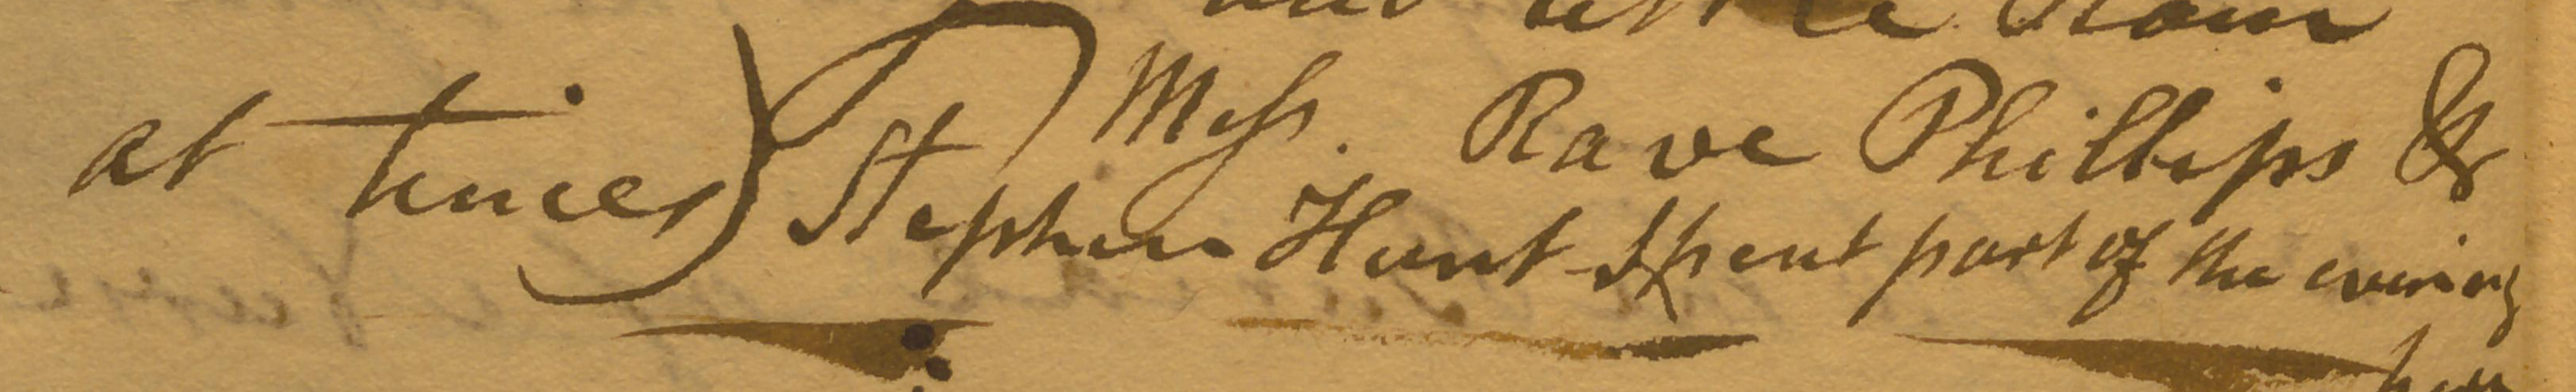at times) Stephen Hunt Spent part of the evening
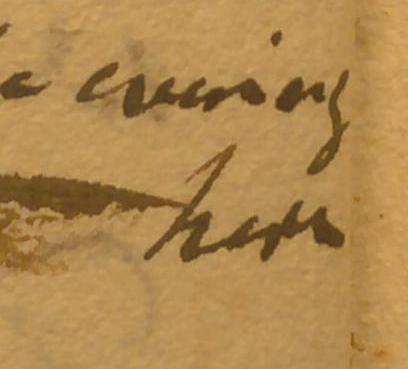here
